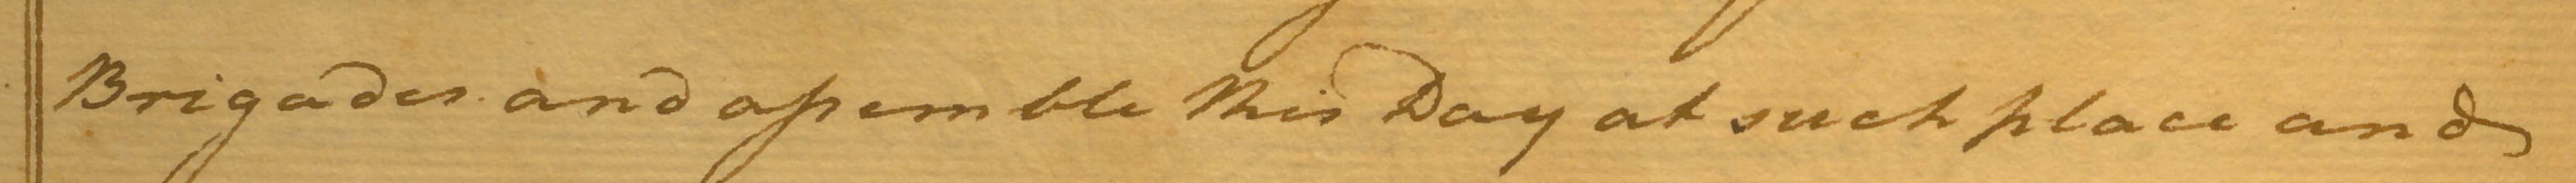Brigades and assemble this Day at such place and
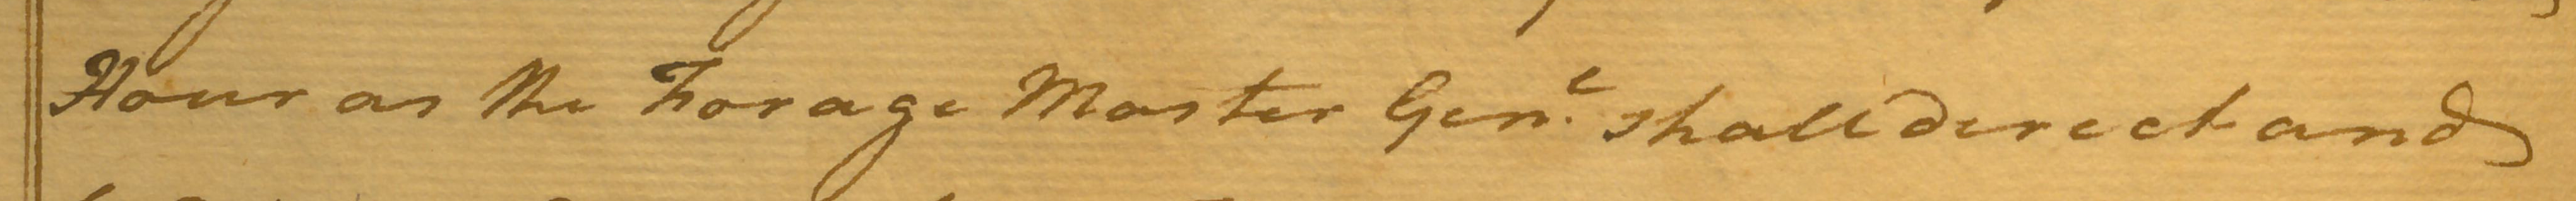Hour as the Forage Master Gen^l. shall direct and
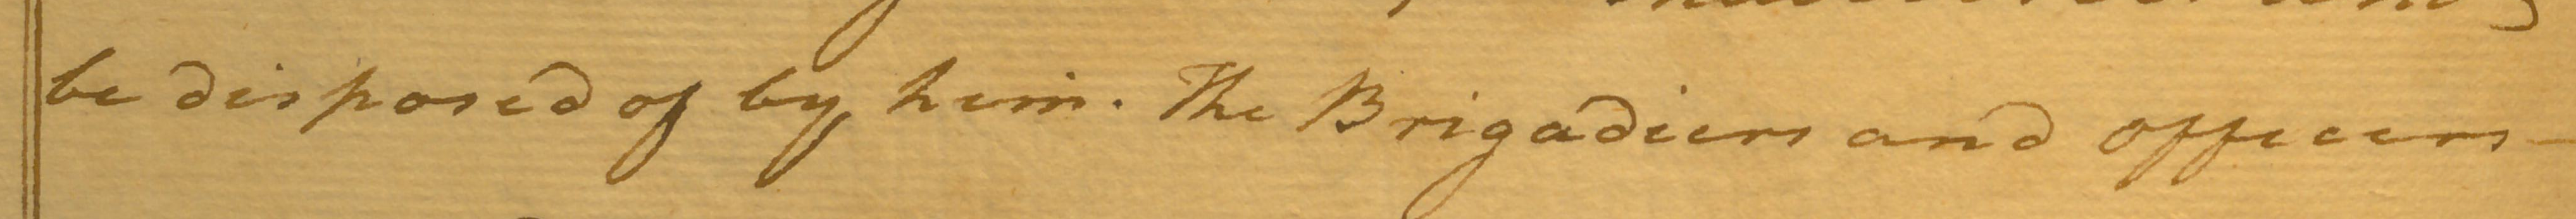be disposed of by him. The Brigadiers and Officers
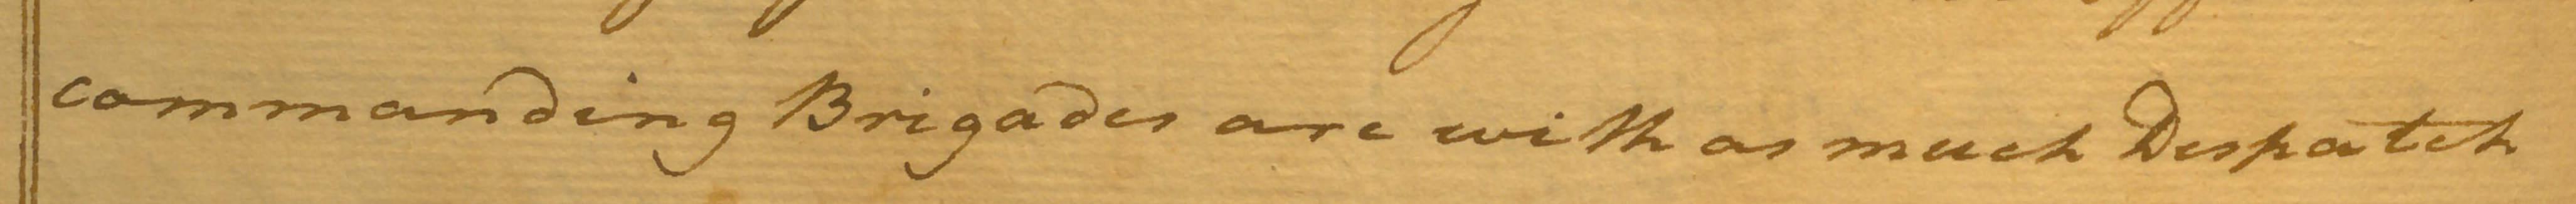commanding Brigades are with as much Despatch
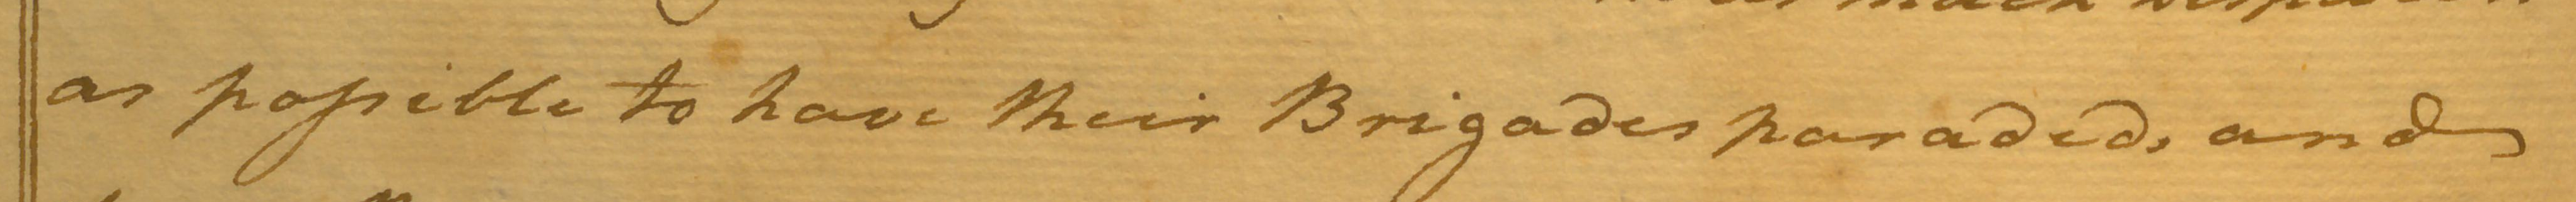as possible to have their Brigades paraded, and
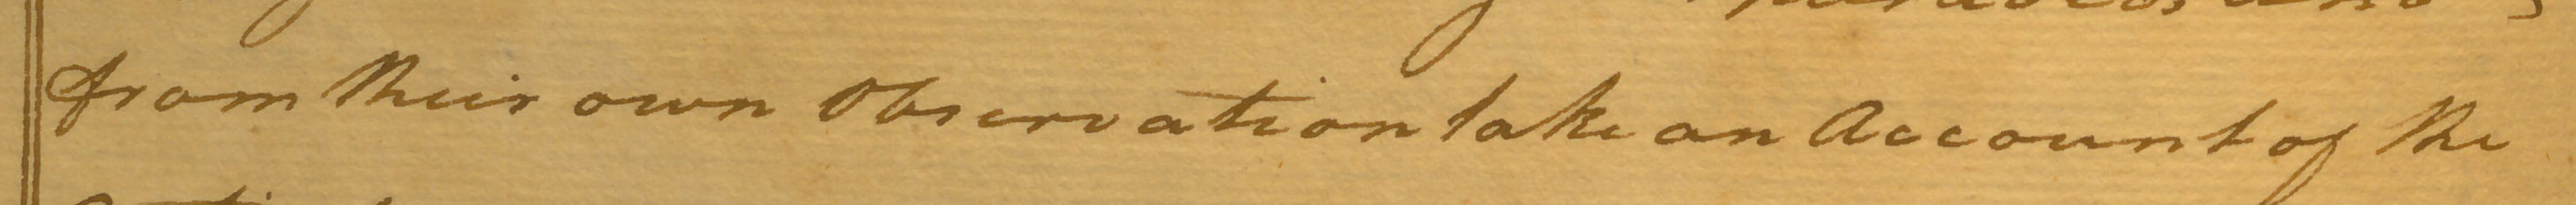from their own Observation take an Account of the
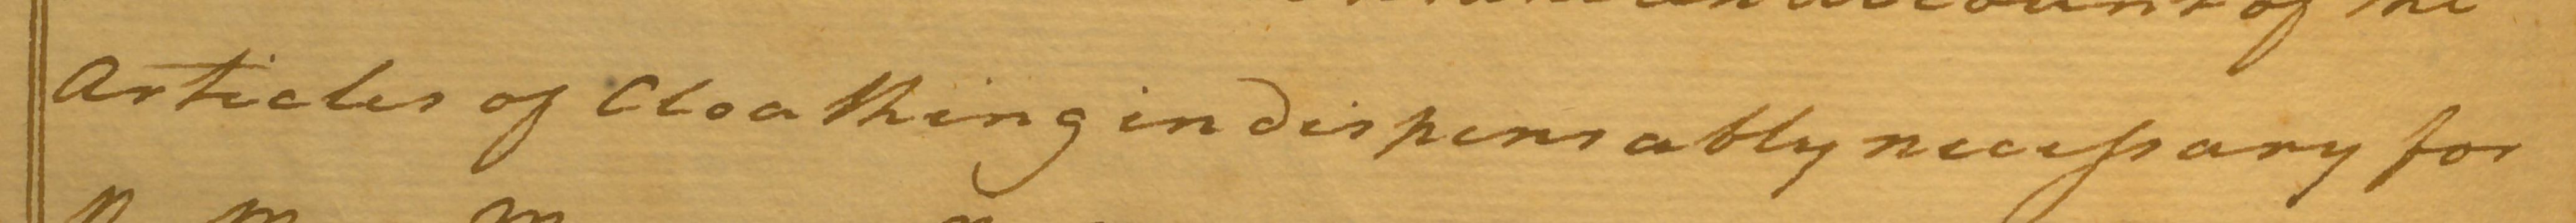Articles of Cloathing indispensably necessary for
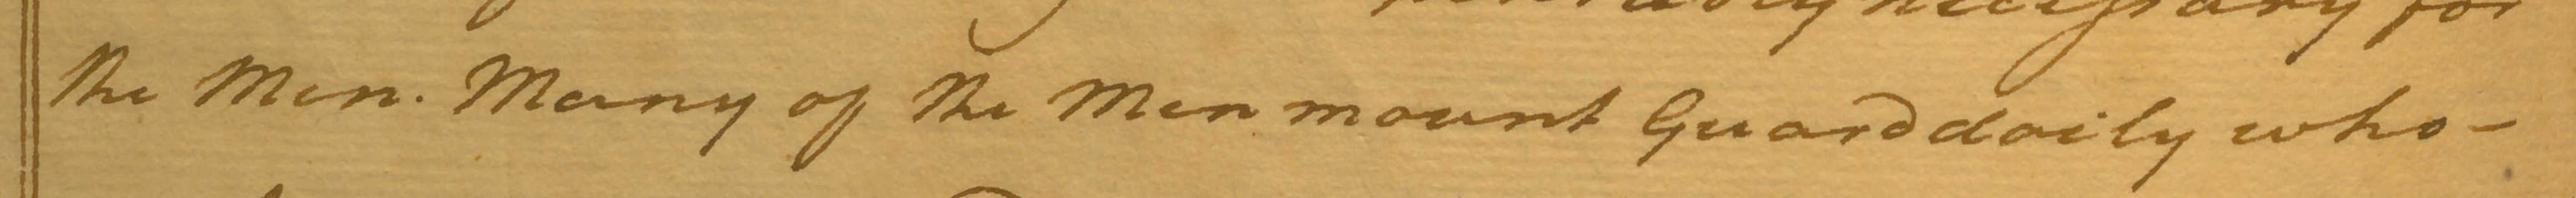the Men. Many of the Men moved Guard daily who-
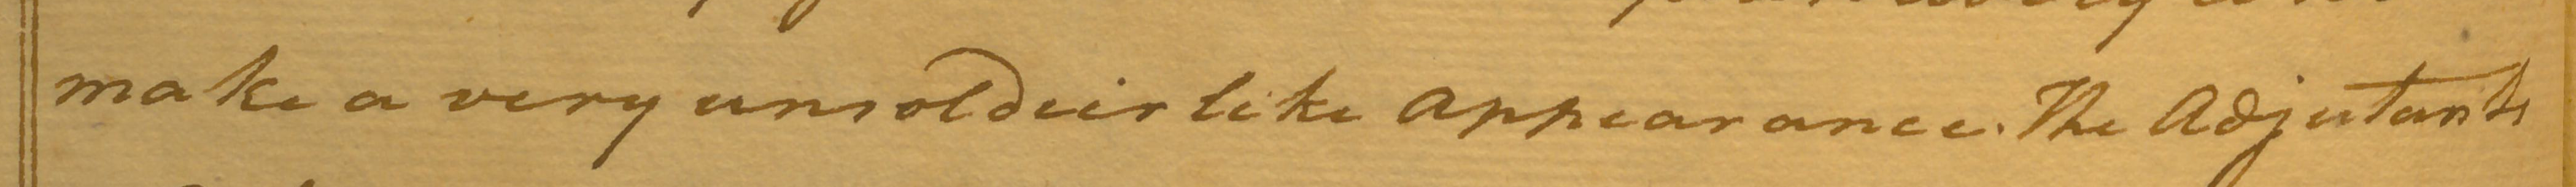make a very unsoldierlike appearance. The Adjutants
